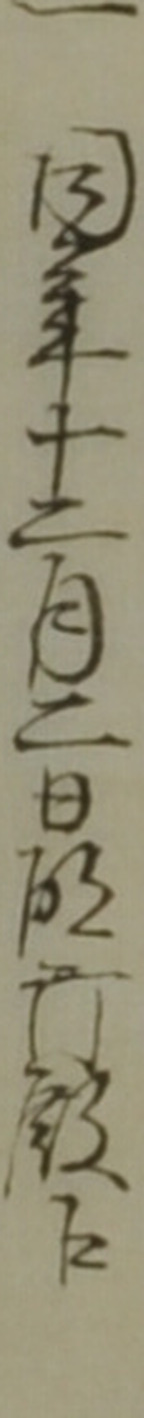一同年十二月二日明御殿江
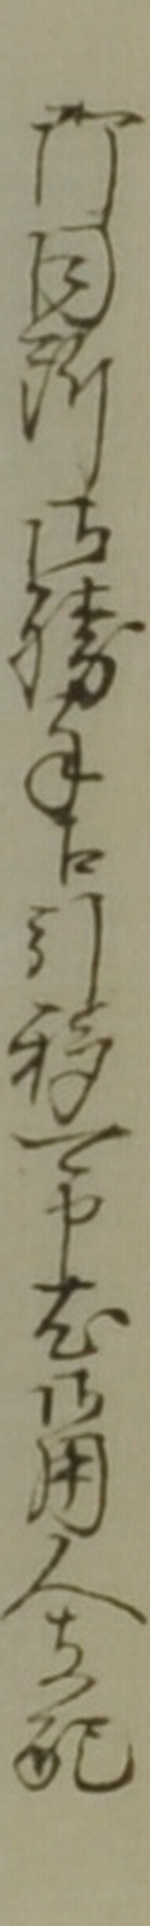御同所御勝手江引移可申尤御用人支配
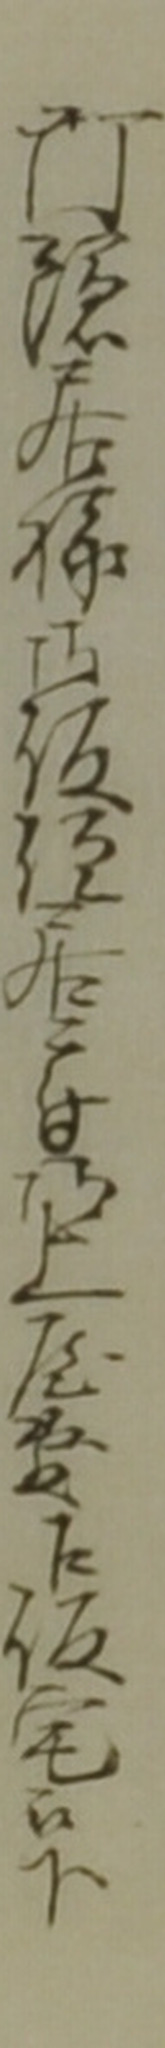御隠居様御仮住居ニ付御上屋敷江仮宅被下
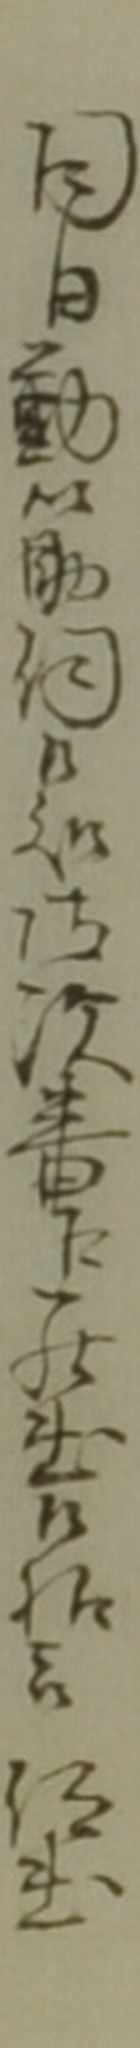同日勤筋伺候処御次番江罷出候様被仰出
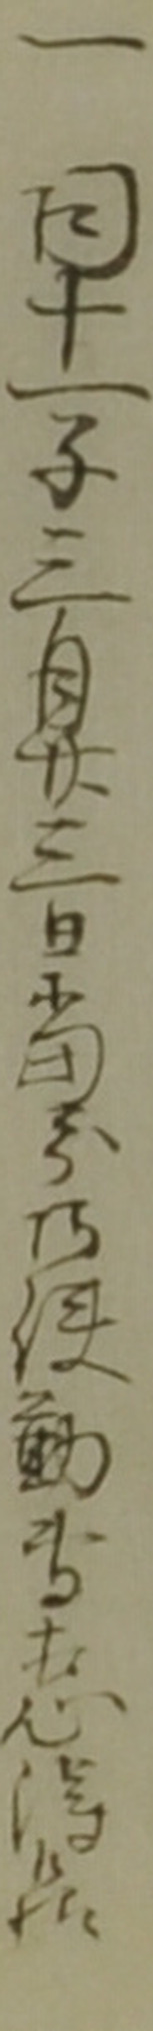一同十一子三月廿三日当分御使勤専相心得候様
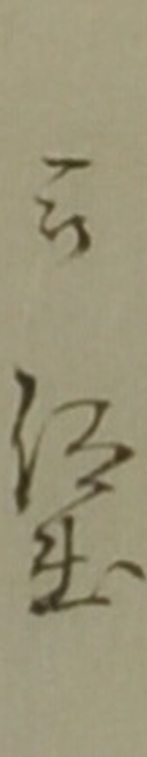被仰出
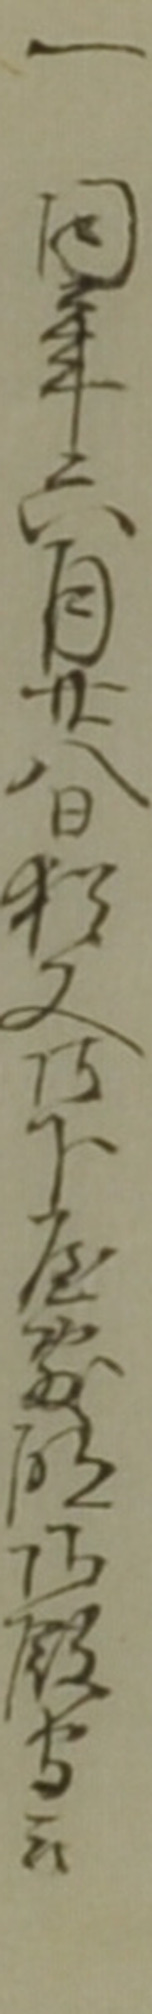一同年六月廿八日猶又御下屋敷明御殿守被
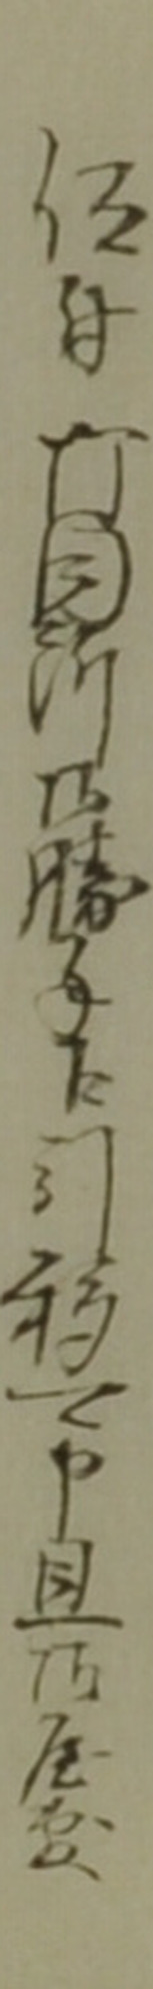仰付御同所御勝手江引移可申且御屋敷
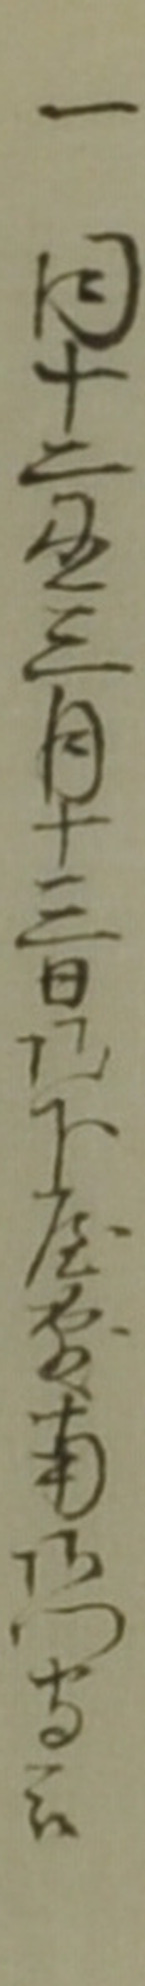一同十二丑三月十三日御下屋敷南御門守被
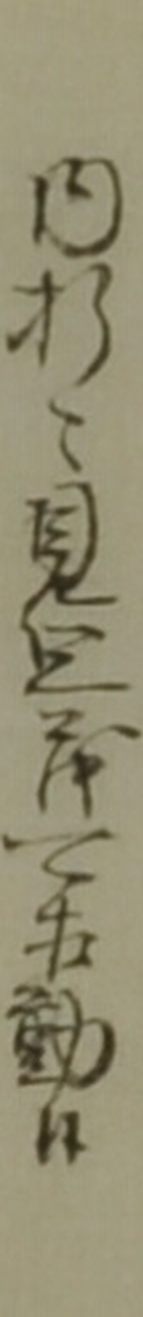内折々見廻茂可相勤候
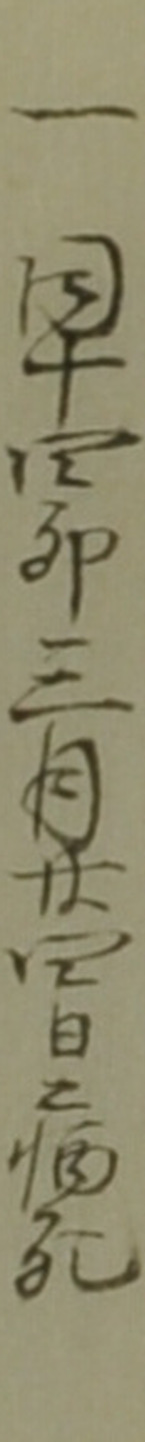一同十四卯三月廿四日病死
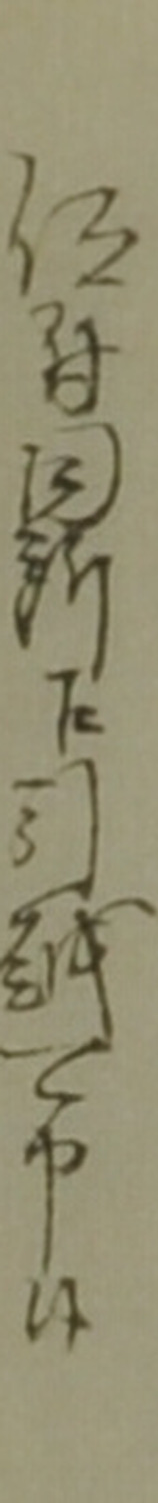仰付同所江引越可申候
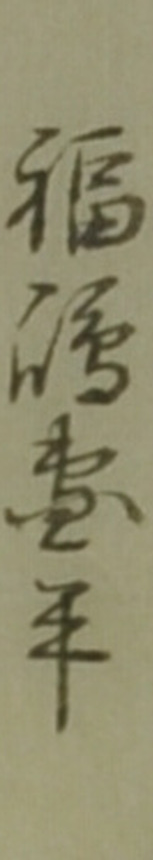福嶋團平
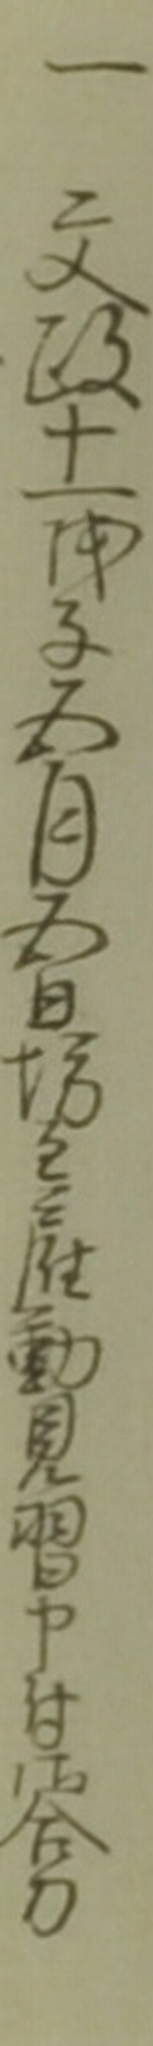一文政十一戊子五月五日坊主雇勤見習申付御合力
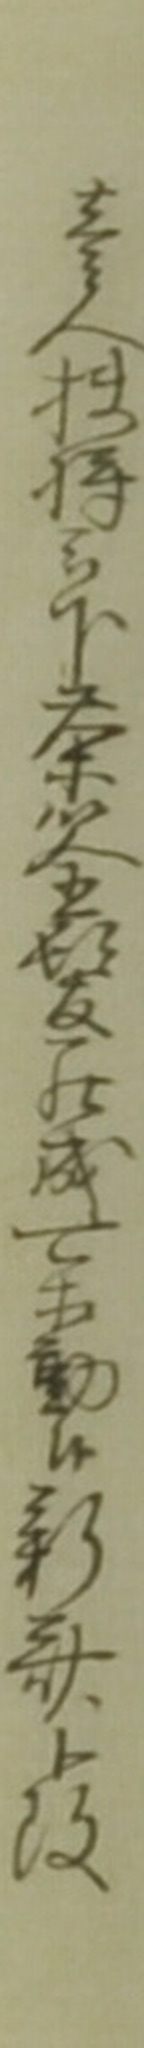壱人扶持被下茶筌髪罷越可相勤候新斎ト改

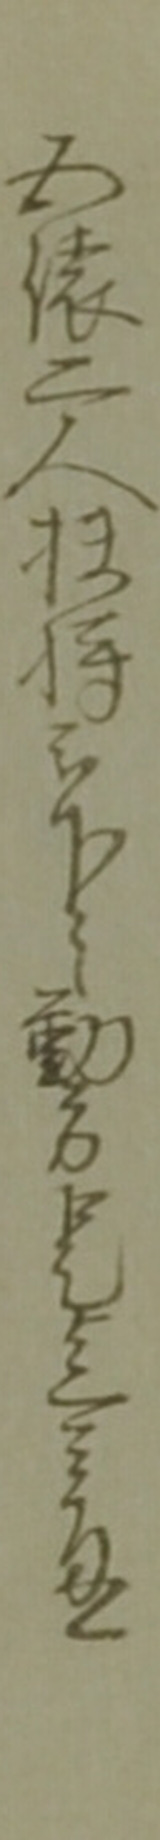五俵二人扶持被下之勤方是迄之通
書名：無足諸士勤仕録（七）
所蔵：伊那市立高遠町図書館・合同会社AMANE
